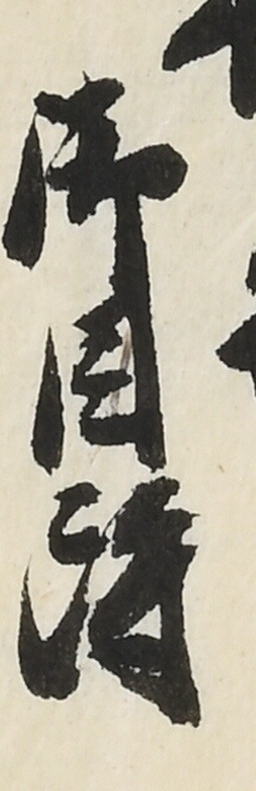御目付
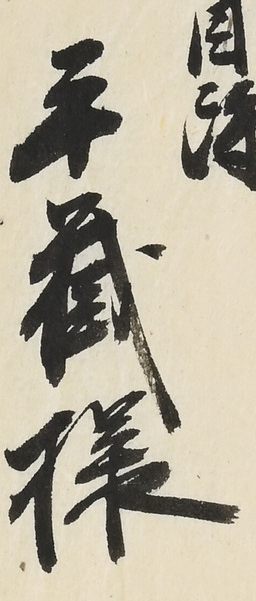平蔵様
